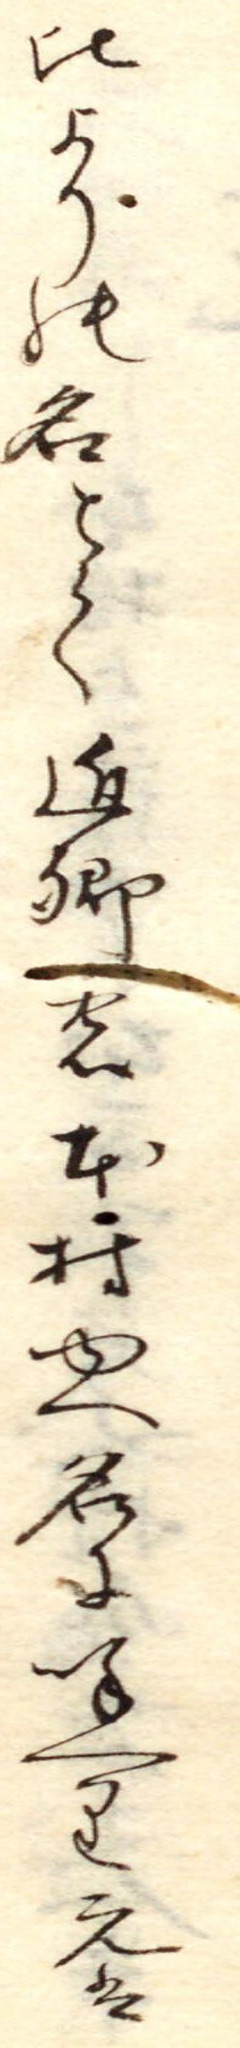比よりの名とて近郷の本村ゆへ名に呼へり元は
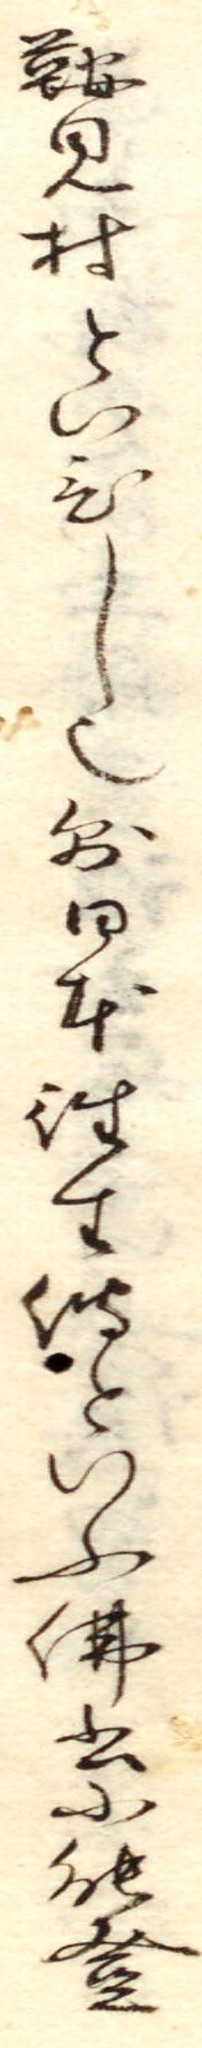鞍見村といひし也則日本往生伝といふ仏書に能登
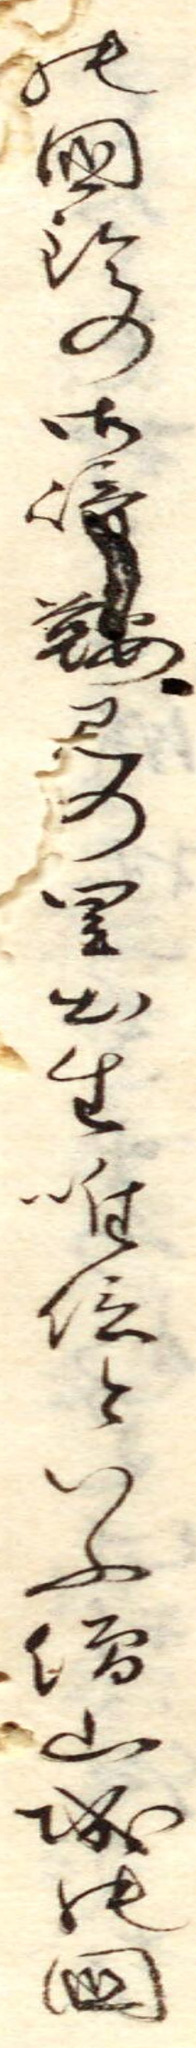の国鈴の御崎鞍見の里出生唯信といふ僧山城の国
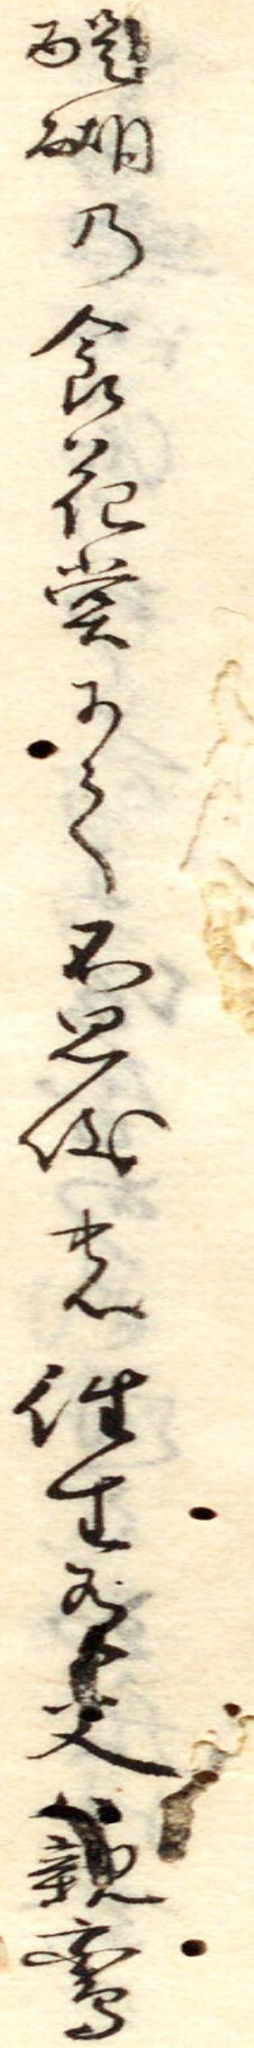醍醐の食花堂にて不思儀の往生有父は親鸞
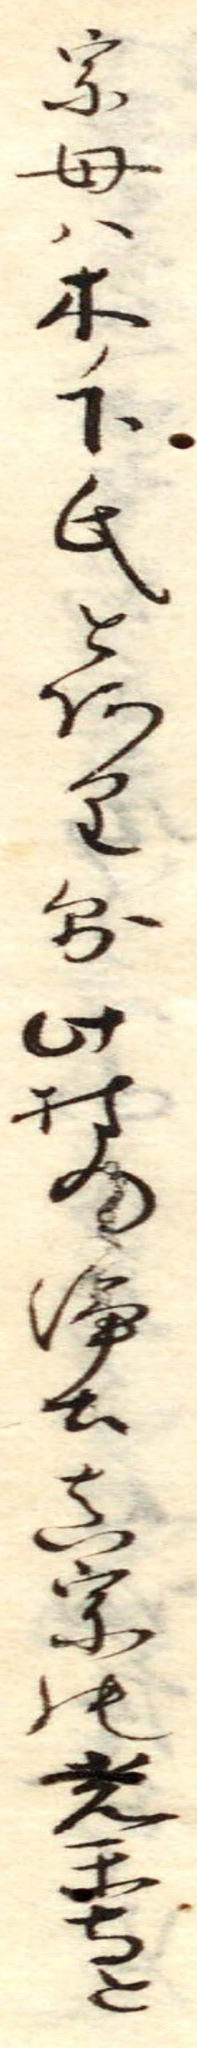宗母は木ノ下氏とあり則此村の浄土真宗の光楽寺と
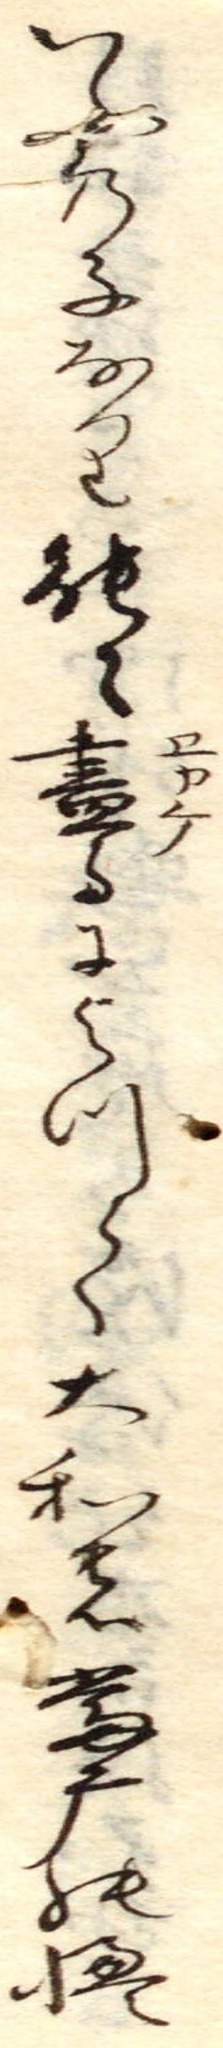いふの子なり能々画るによつて大和の当麻の慢
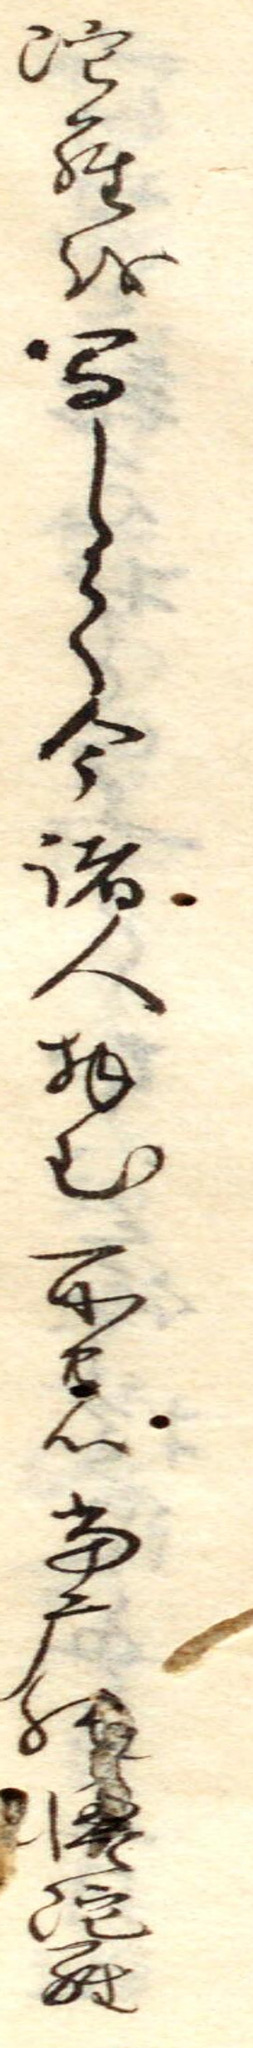陀羅を写して今諸人拝む所の当麻の慢陀羅
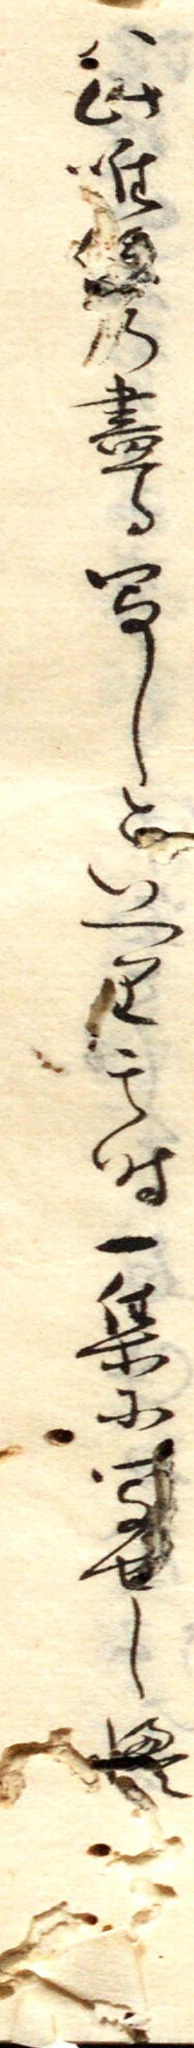は此唯信の画る写しといへり其時一集に写せし慢
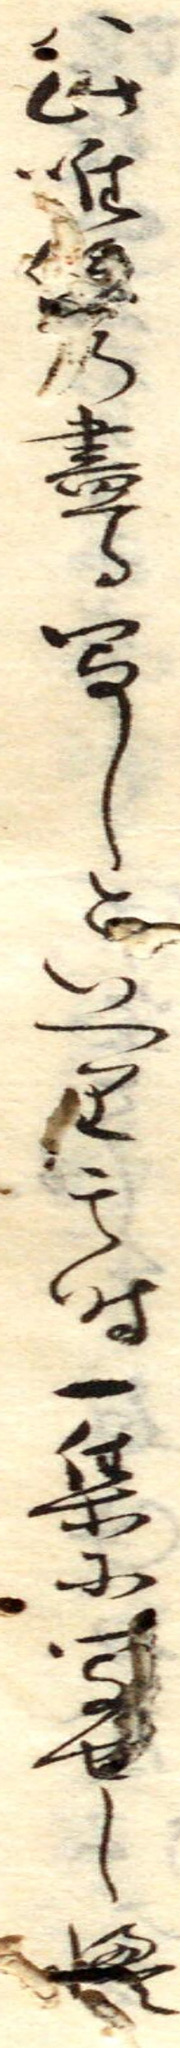は此唯信の画る写しといへり其時一集に写せし慢
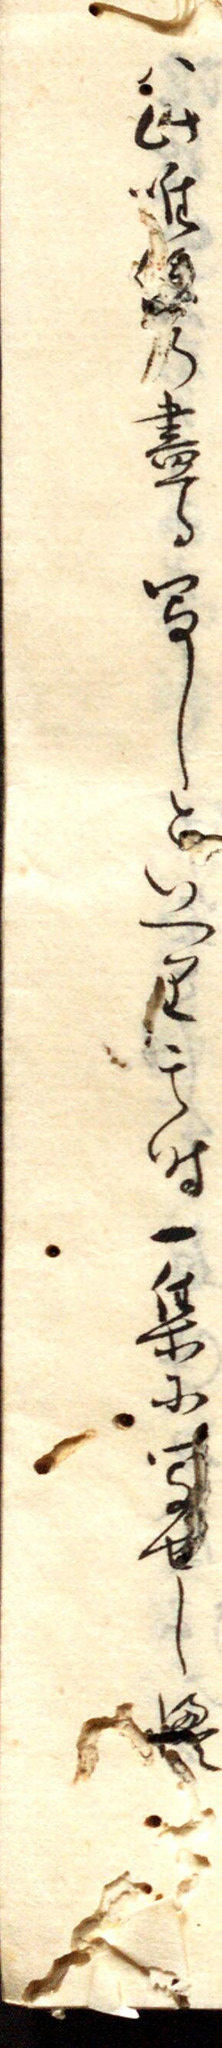は此唯信の画る写しといへり其時一集に写せし慢

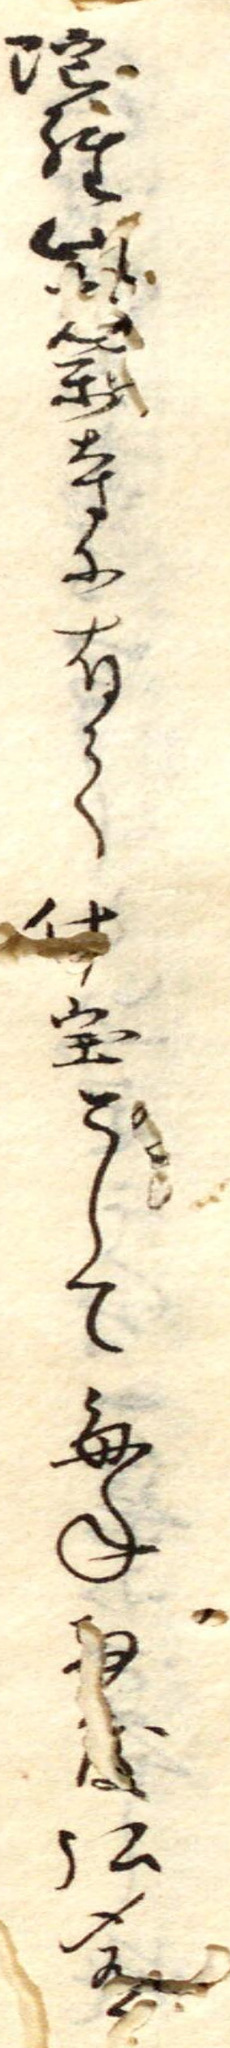陀羅此光楽寺に有て什宝として毎年両度弘メ有
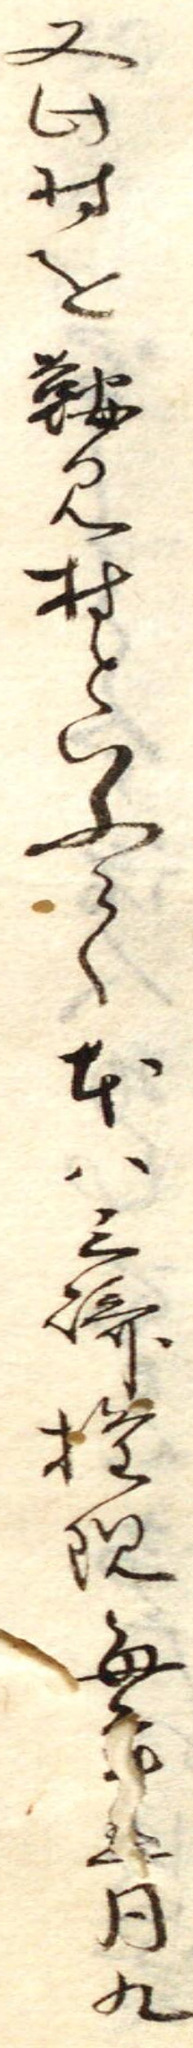又此村を鞍見村といふて本は三崎権現毎年三月九
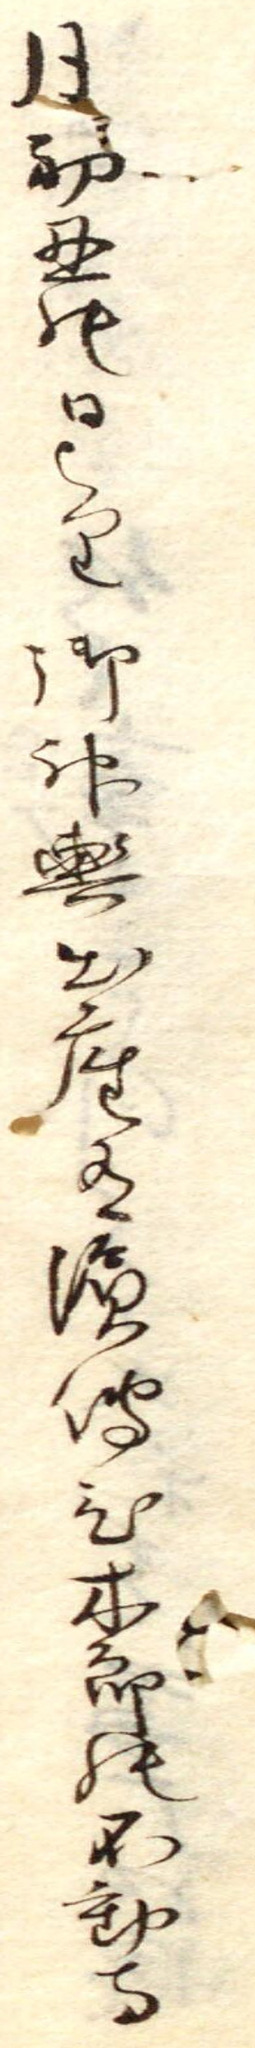日初丑の日より御神輿出座有浜伝ひ木郎の不動寺
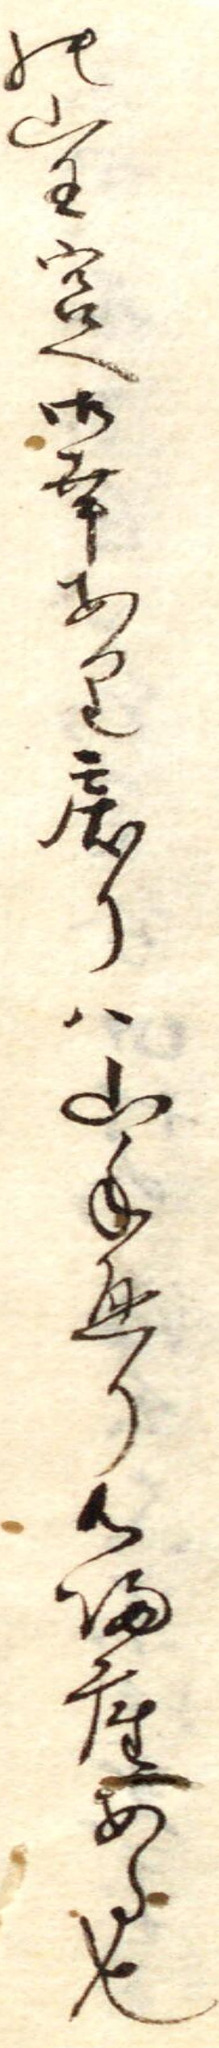の山王宮へ御幸あり戻りは山手通り御帰座ある也
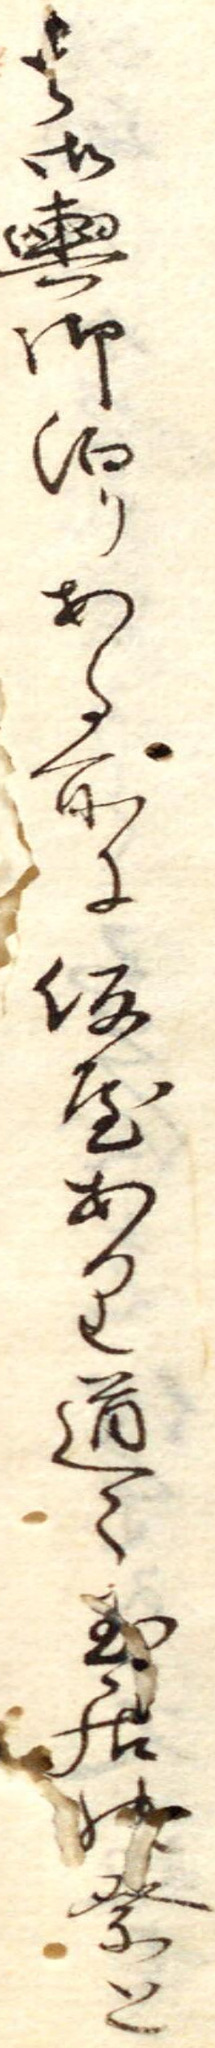其御輿御泊りある所に仮屋あり道々至居の祭と
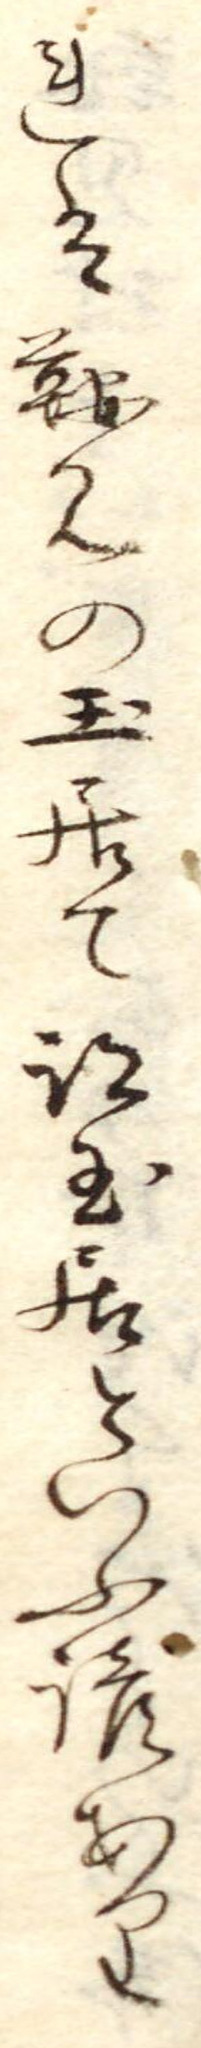れは鞍見の玉居て跡至居といふ諺あり
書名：能登名跡誌
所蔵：Ishikawa Prefectural Library
